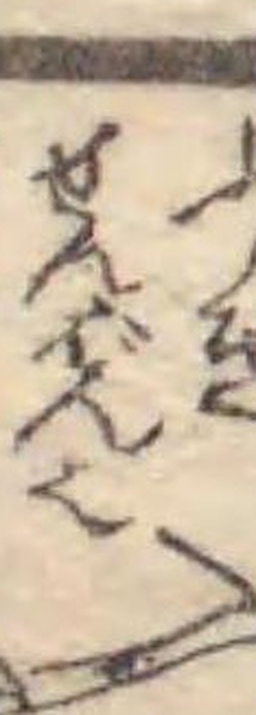せんばん也
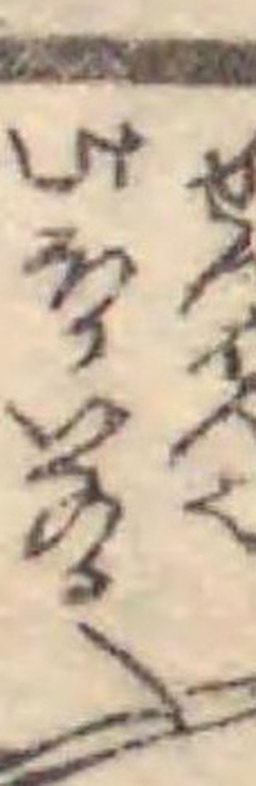此ほかいなか
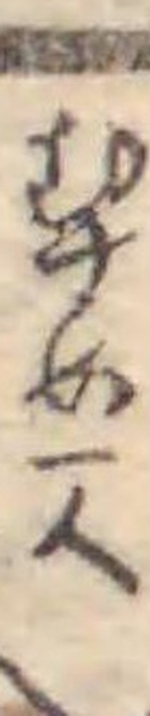むすめ一人
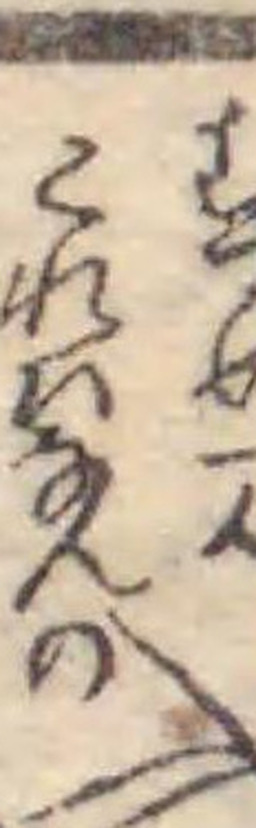これはなんの
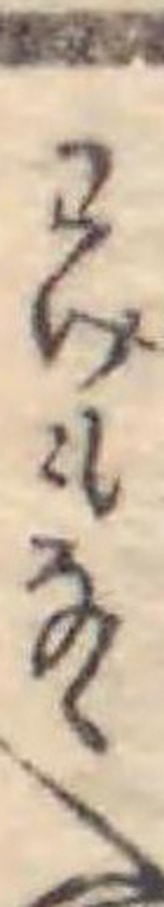わけもなく
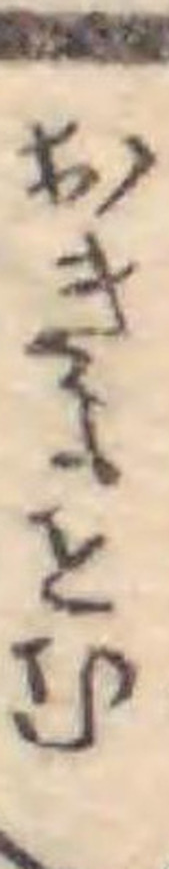おきよをむ
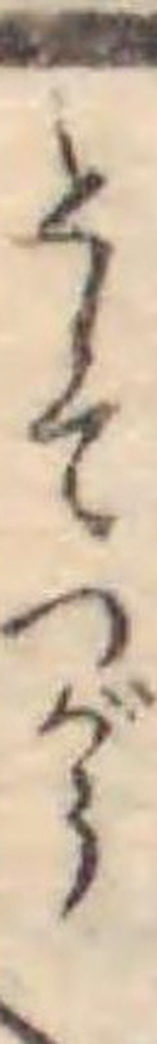としてつがう
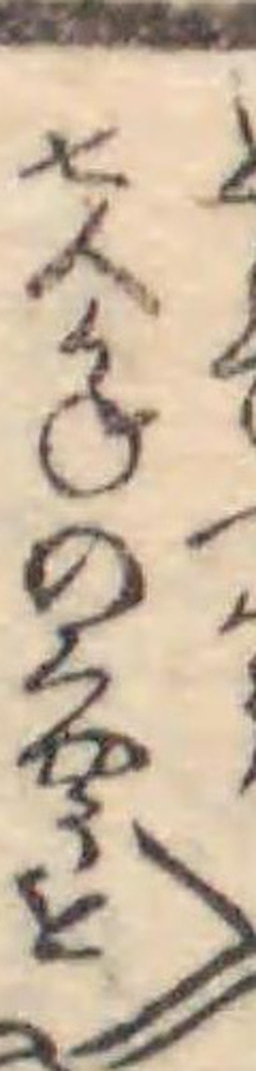七人かねのくやうを
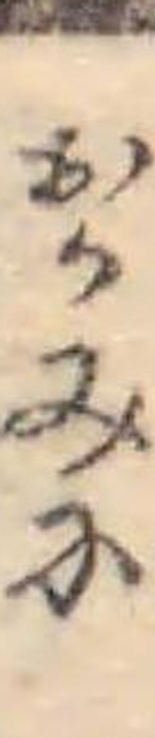おかみに
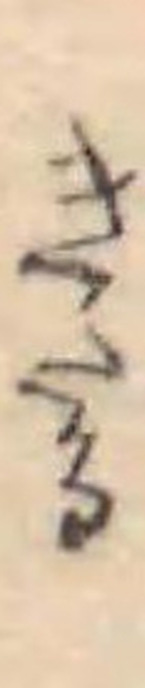きたる

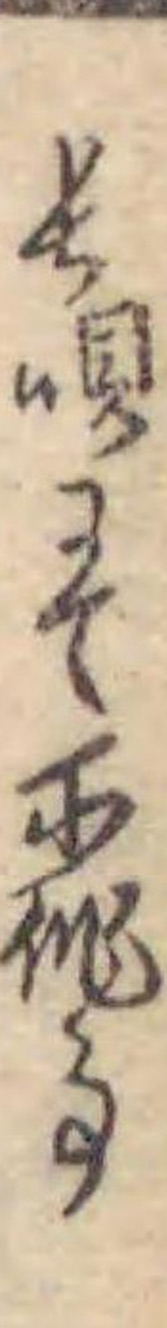長唄にて所作事
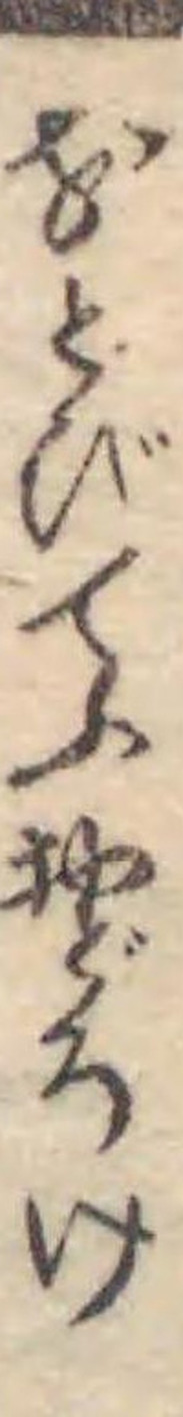花とびてふおどろけ
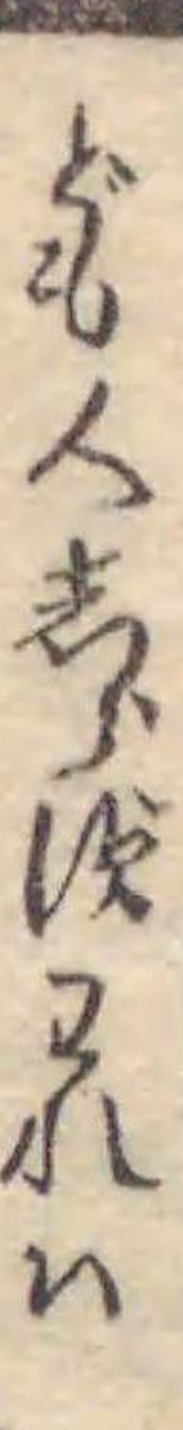ども人しらずわれは
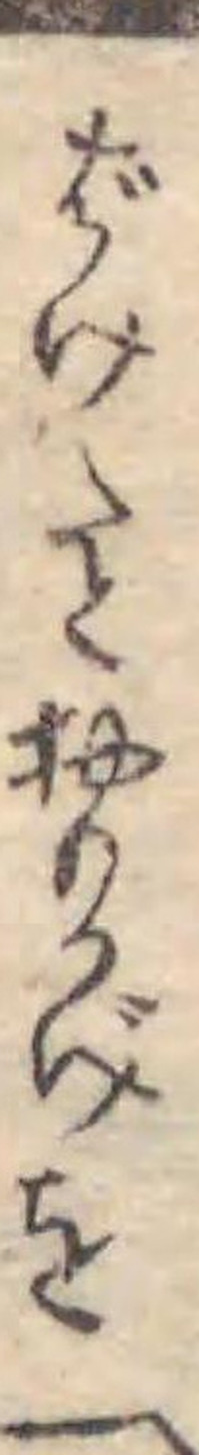ばけたとおもかげを
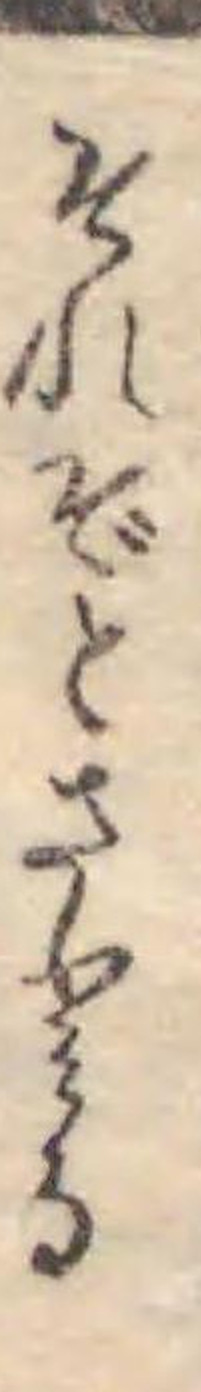それぞとさとる
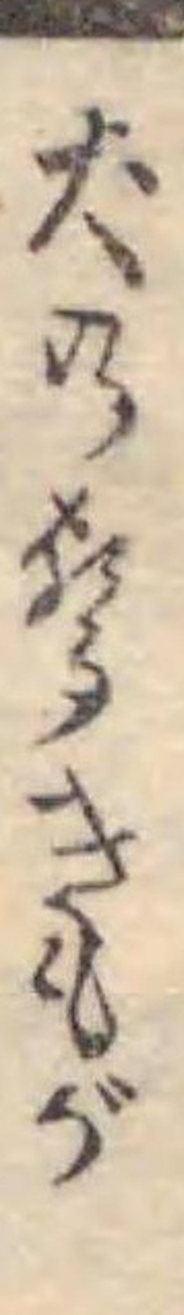犬の声きもが
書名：鐘入七人化粧 : 3巻
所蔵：国立国会図書館 National Diet Library, JAPAN
